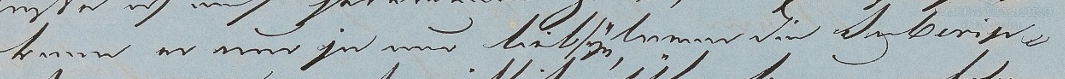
kann es uns ja nur lieb seyn, wenn die Subcrip-
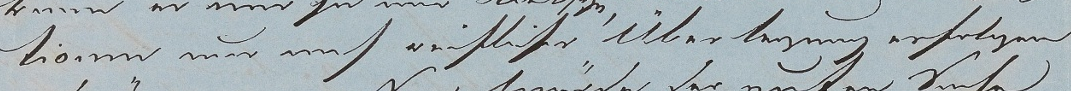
tionen nur nach reiflicher Überlegung erfolgen
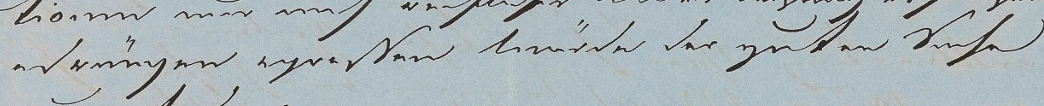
drängen & preßen würde der guten Sache
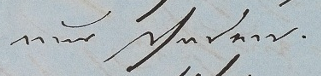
nur schaden.
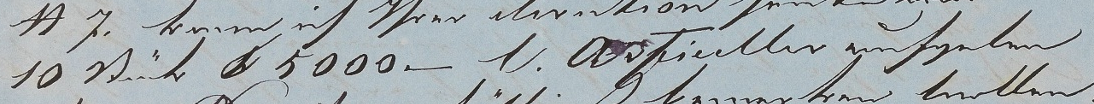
10 Stück à 5000.– ...A...ieller aufgeben
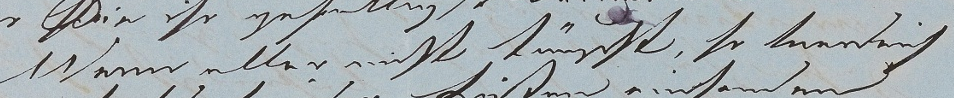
Wenn alles nicht täuscht, so werde ich
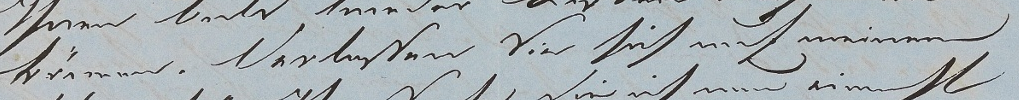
können. Verlassen Sie sich auf meinen
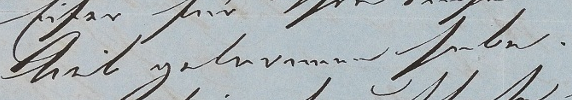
lieb gewonnen habe.
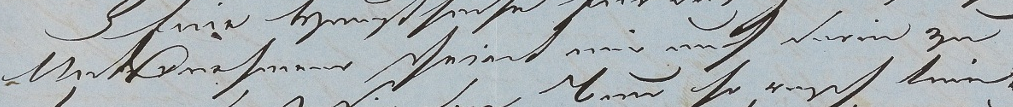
Unternehmens scheint mir auch darin zu
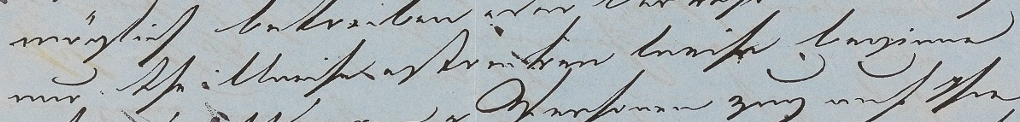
nur theilweise & strecken weise beginne
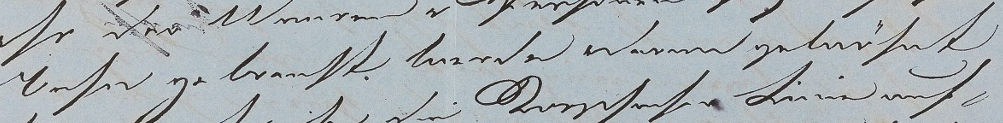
Bahn gebracht werde & daran gewöhnt
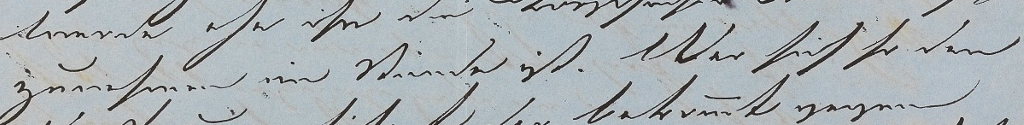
zunehmen im Stande ist. Wer sich so den
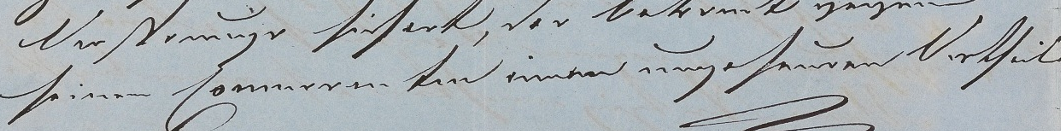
seinen Concurrenten einen ungeheuren Vortheil.
